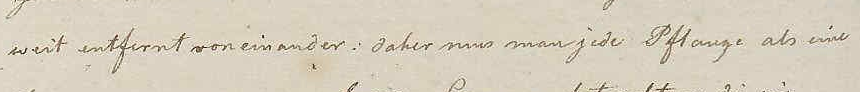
weit entfernt von einander: daher mus man jede Pflanze als eine
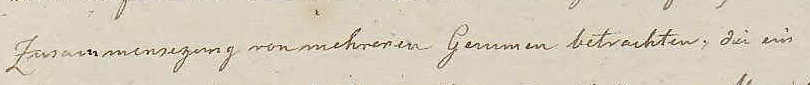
Zusammensezung von mehreren Gemmen betrachten, die ein
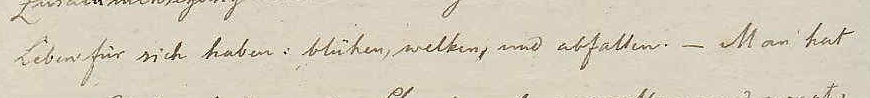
Leben für sich haben: blühen, welken, und abfallen. – Man hat
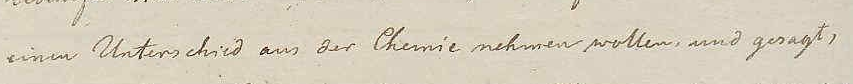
einen Unterschied aus der Chemie nehmen wollen, und gesagt,
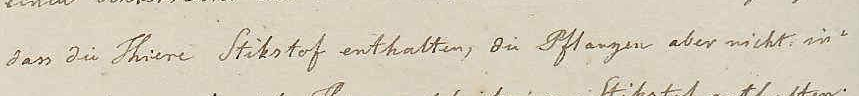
dass die Thiere Stikstof enthalten, die Pflanzen aber nicht: in-
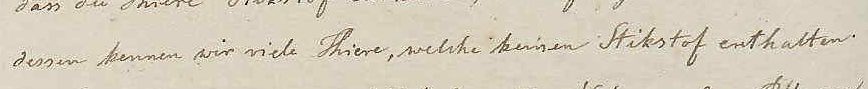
dessen kenne wir viele Thiere, welche keinen Stikstof enthalten.
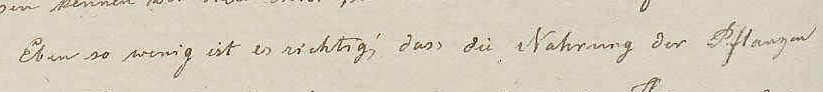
Eben so wenig ist es richtig, dass die Nahrung der Pflanzen
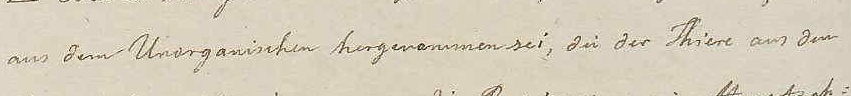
aus dem Unorganischen hergenommen sei, die der Thiere aus den
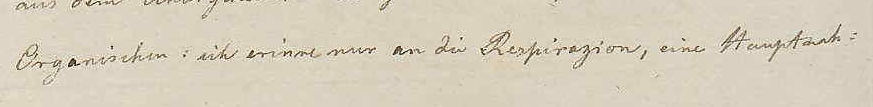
Organischen: ich erinre nur an die Respirazion, eine Hauptnah-
